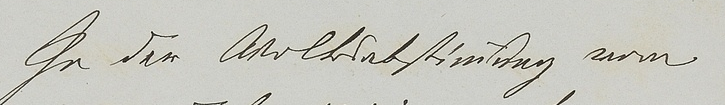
In der Volksabstimmung vom
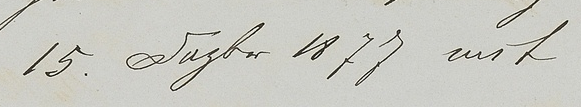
15. Dezbr 1877 mit
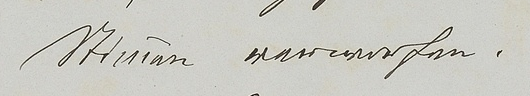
Stimmen verworfen.
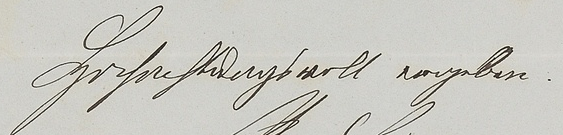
Hochachtungsvoll ergeben.
